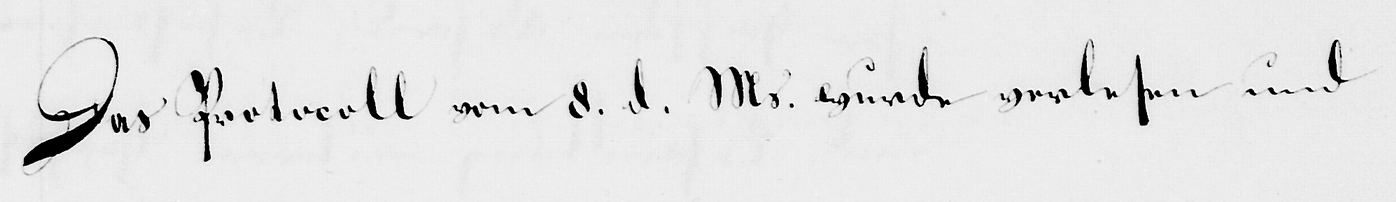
Das Protocoll vom 8. d. Ms. wurde verlesen und
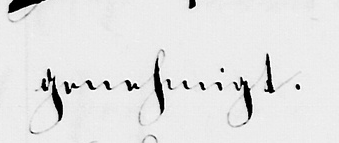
genehmigt.
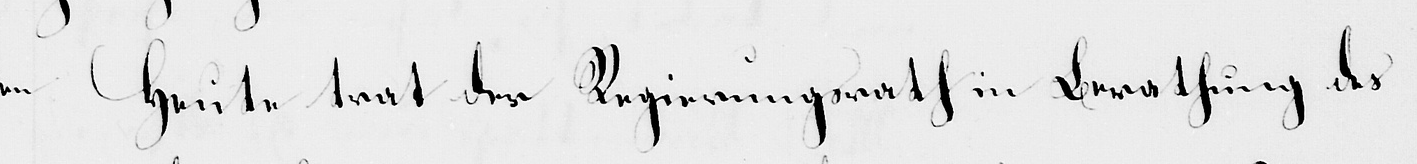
Heute trat der Regierungsrath in Berathung des
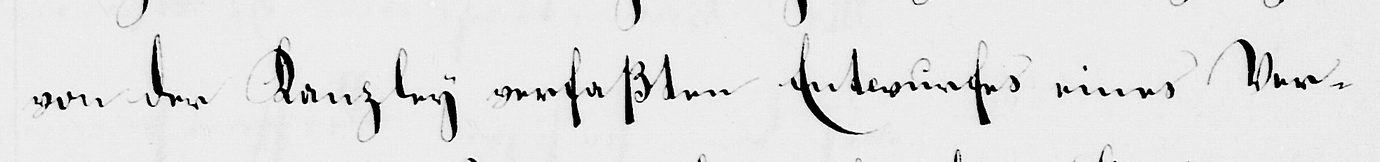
von der Kanzley verfaßten Entwurfes eines Ver¬
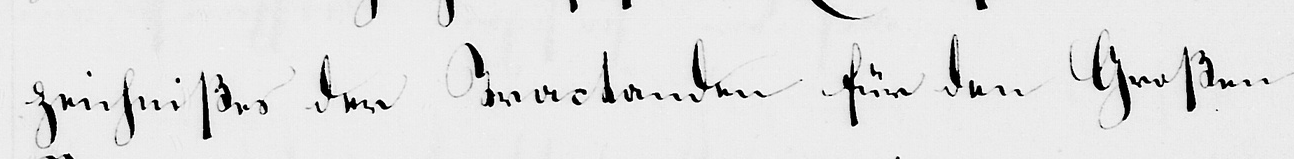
zeichnißes der Tractanden für den Großen
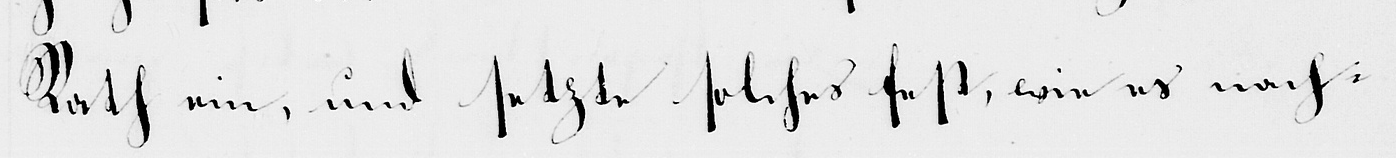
Rath ein, und setzte solches fest, wie es nach¬
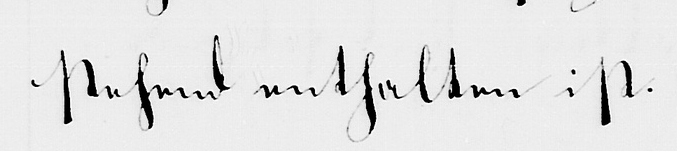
stehend enthalten ist.
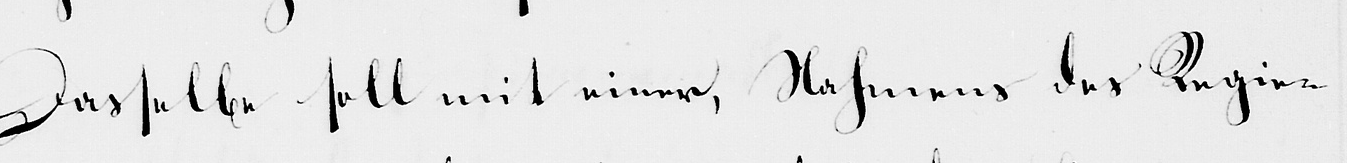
Dasselbe soll mit einer, Nahmens des Regie¬
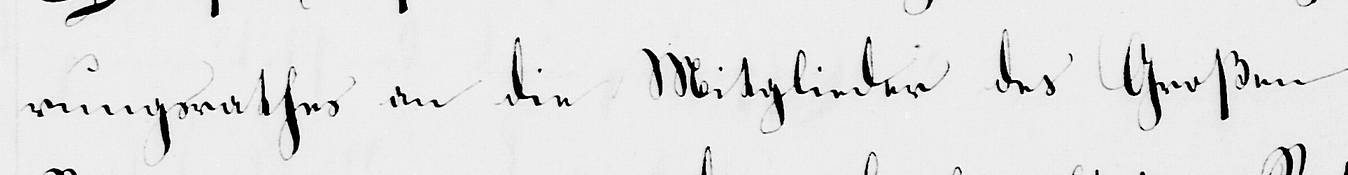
rungsrathes an die Mitglieder des Großen
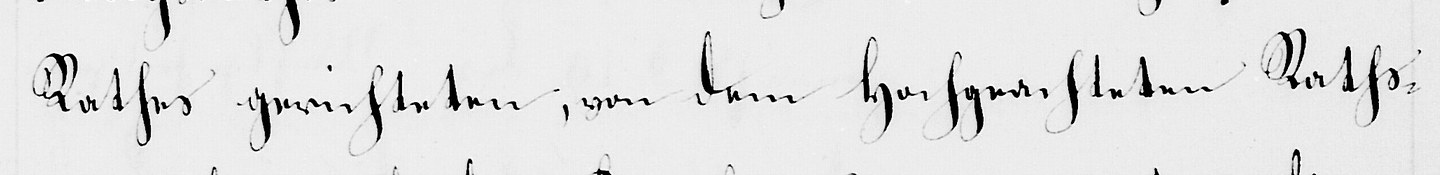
Rathes gerichteten, von dem Hochgeachteten Raths¬
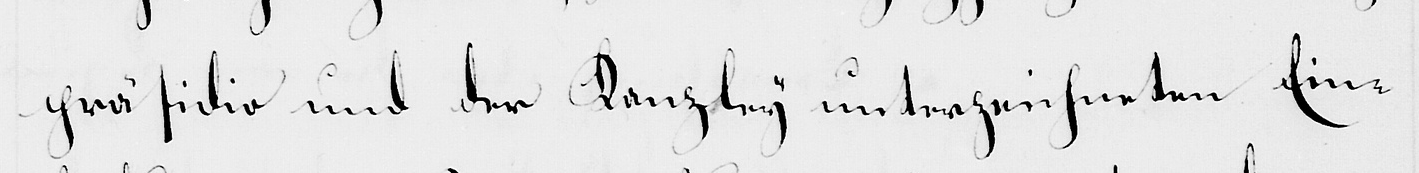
präsidio und der Kanzley unterzeichneten Ein¬
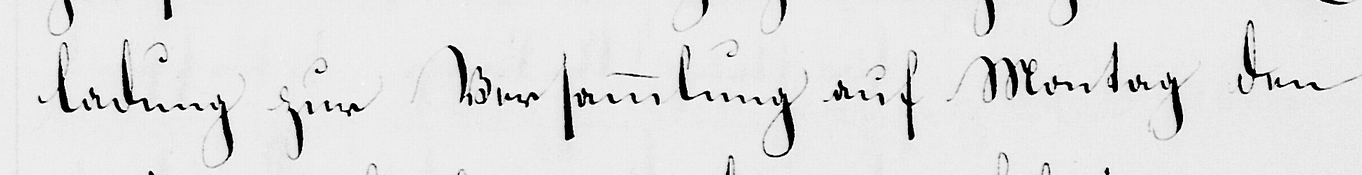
ladung zur Versammlung auf Montag den
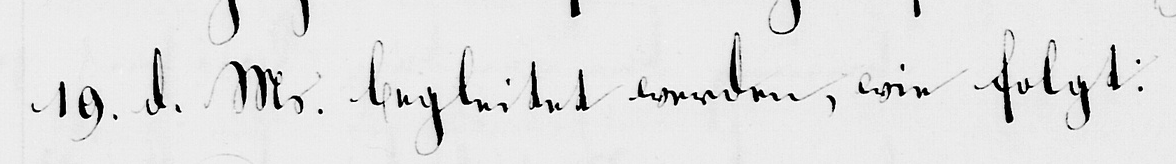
19. d. Ms. begleitet werden, wie folgt.
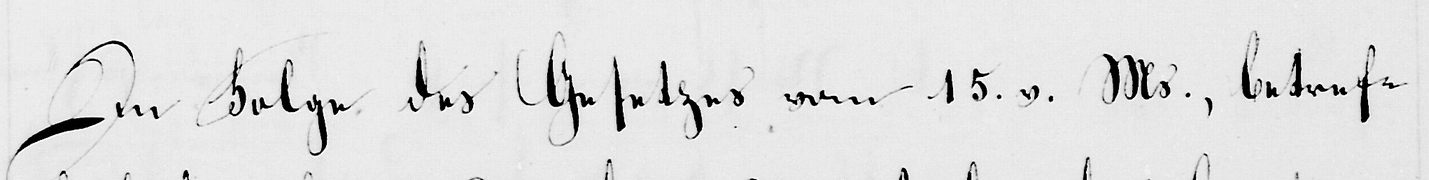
In Folge des Gesetzes vom 15. v. Ms., betref¬
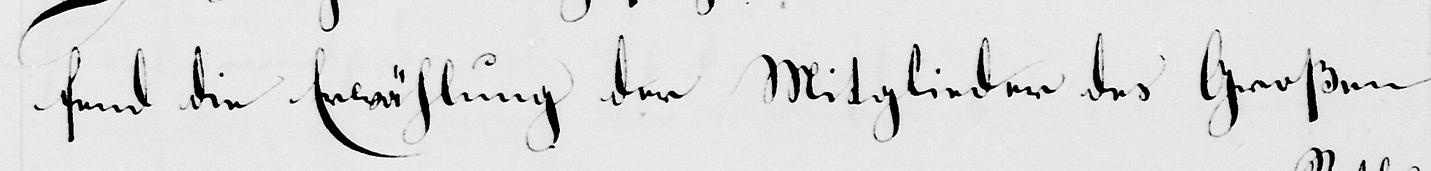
fend die Erwählung der Mitglieder des Großen
